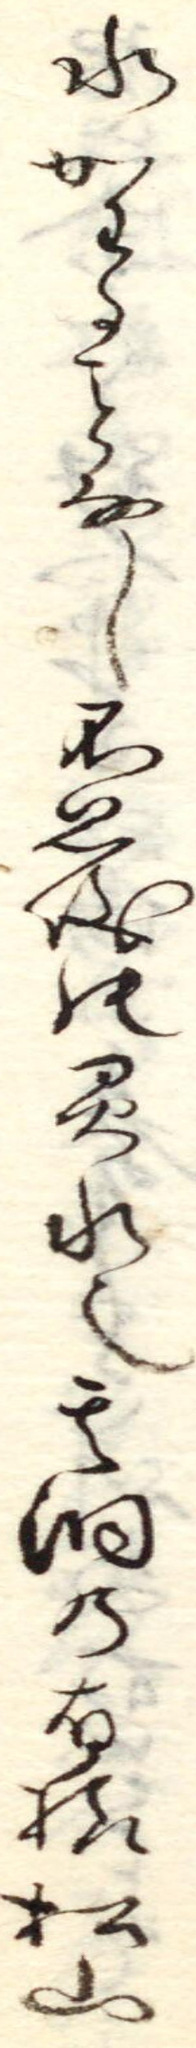水かわるゝことなし不思議の霊水也其洞の有様松山
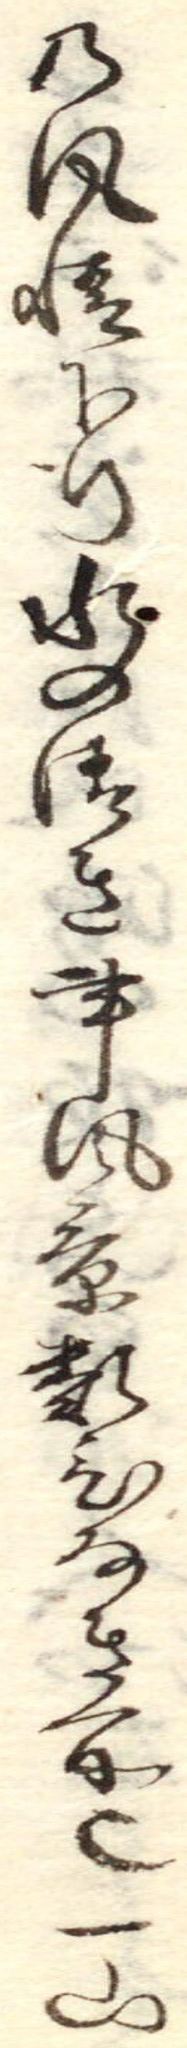の風情下行水の清き事風景類ひなき所也一山
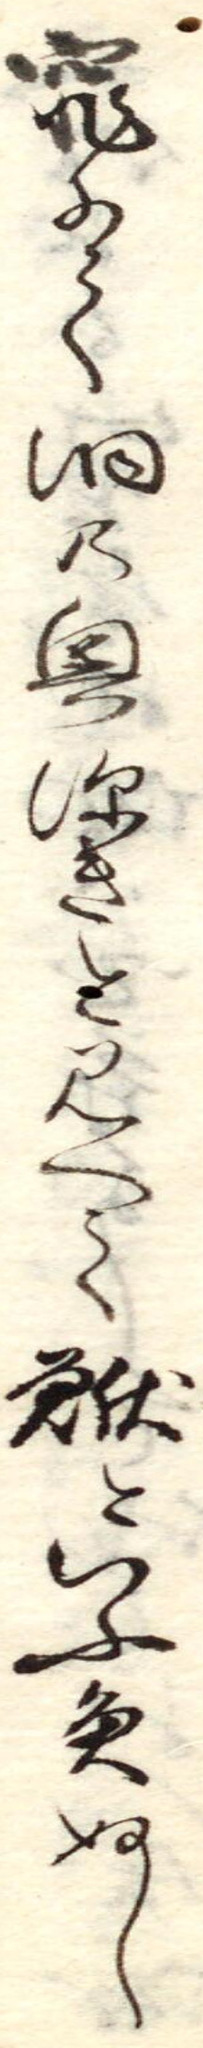窕？にて洞の奥深きと見へて鮲といふ魚ぬし
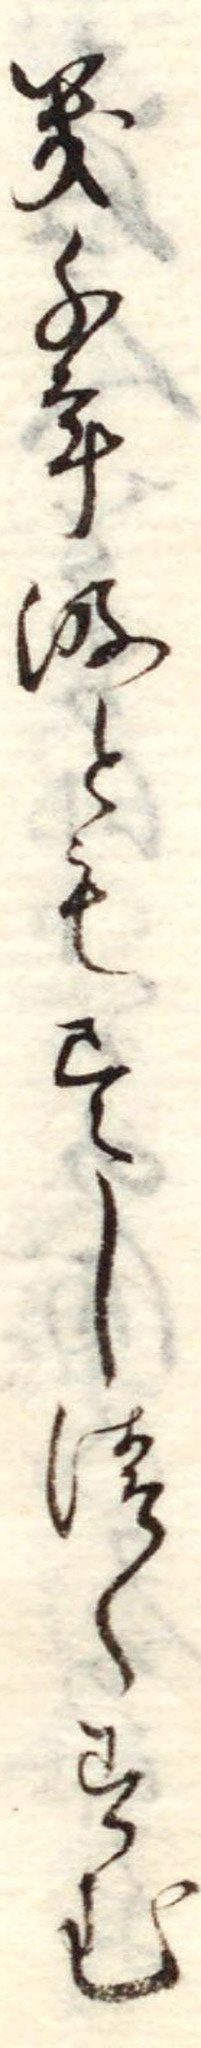幾千年汲とも尽し清くすむ
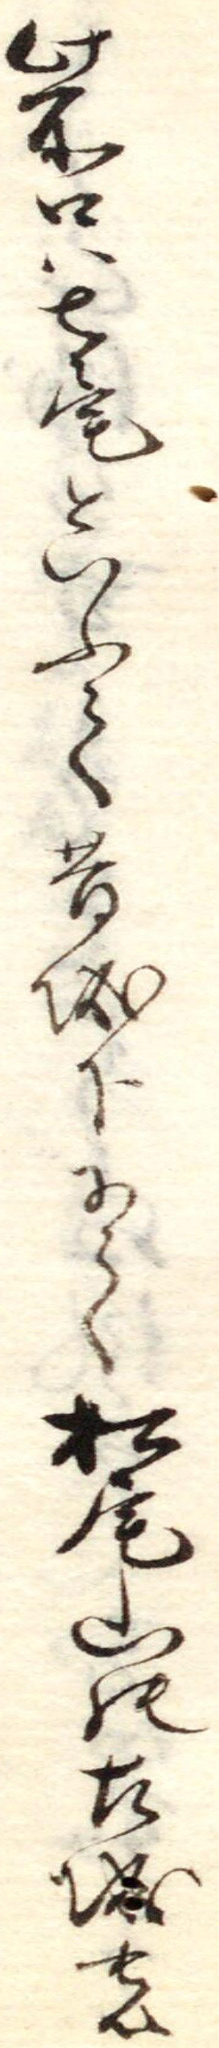此所口は七尾といふて昔城下にて松尾山の古城の
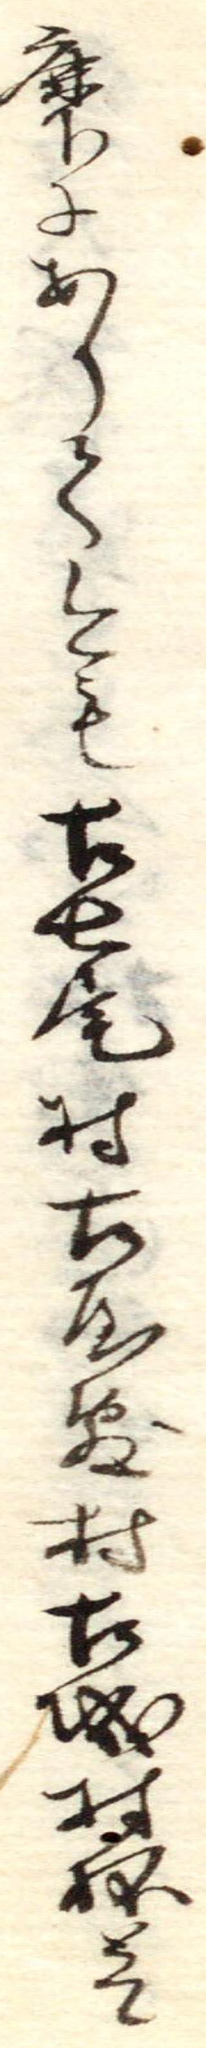鹿下にありて今も古七尾村古屋敷村古城村抔とて
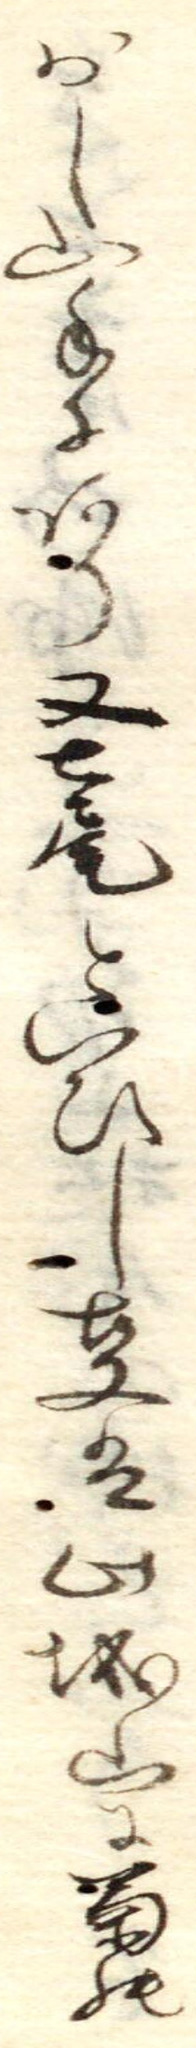少し山手にあり又七尾といひし事は此城山に菊の
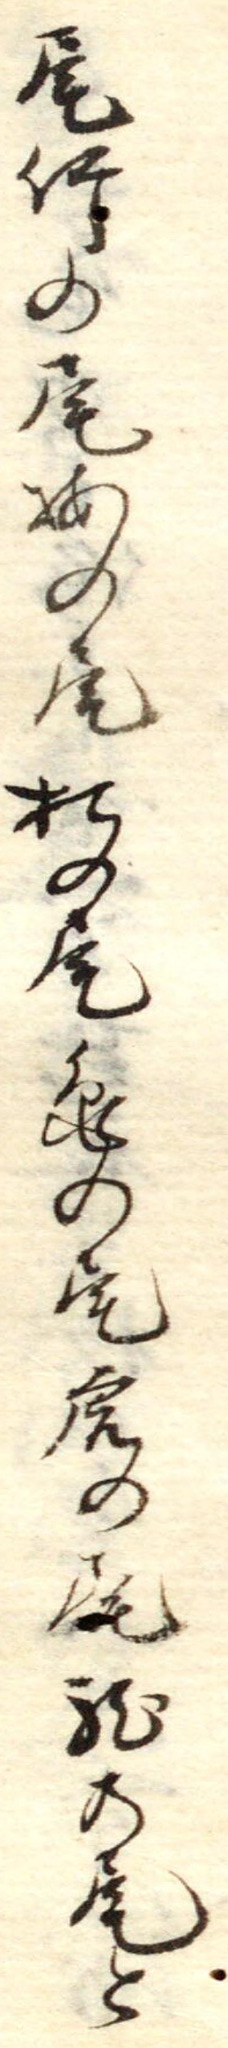尾竹の尾梅の尾松の尾亀の尾虎の尾龍の尾と

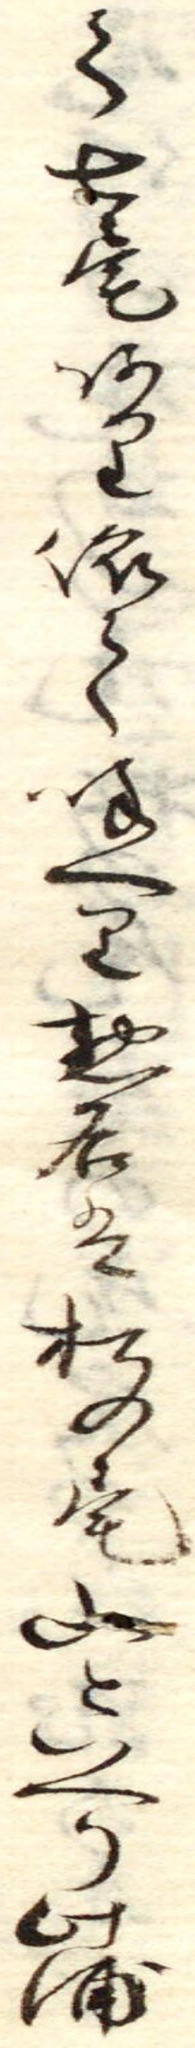て七尾あり依て呼へり惣名は松の尾山といへり此浦
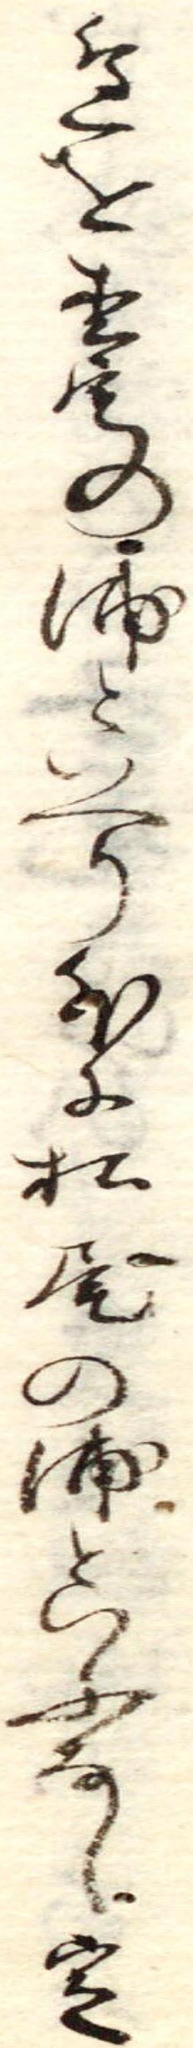辺を枩尾の浦といへり外に松尾の浦といふなし定
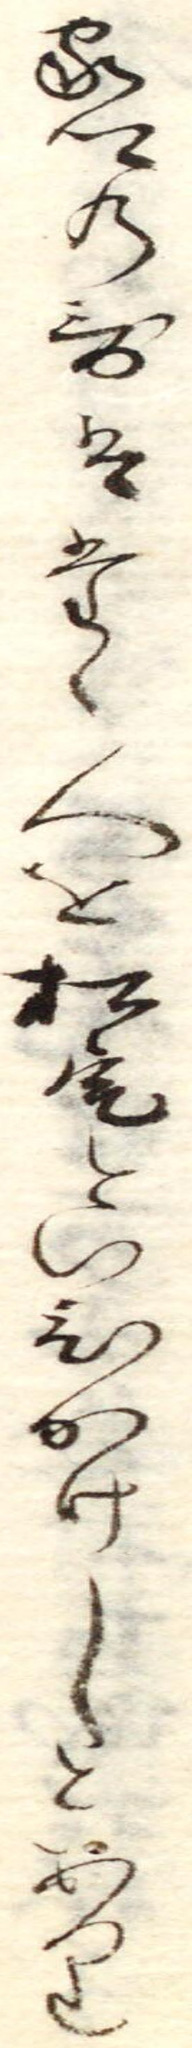家卿の哥はたゝ人を松尾といひかけしとあり
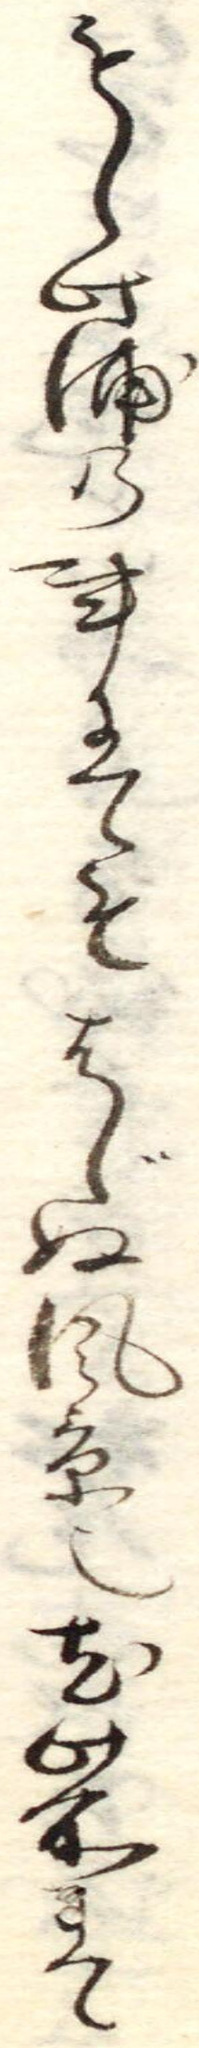もし此浦の事にてもはじぬ風景也尤此所にて
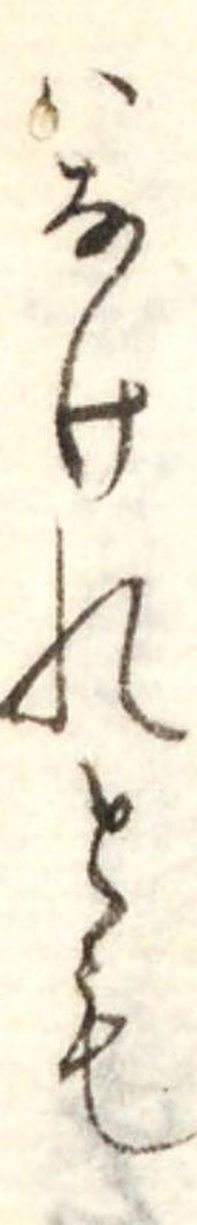はなけれとも
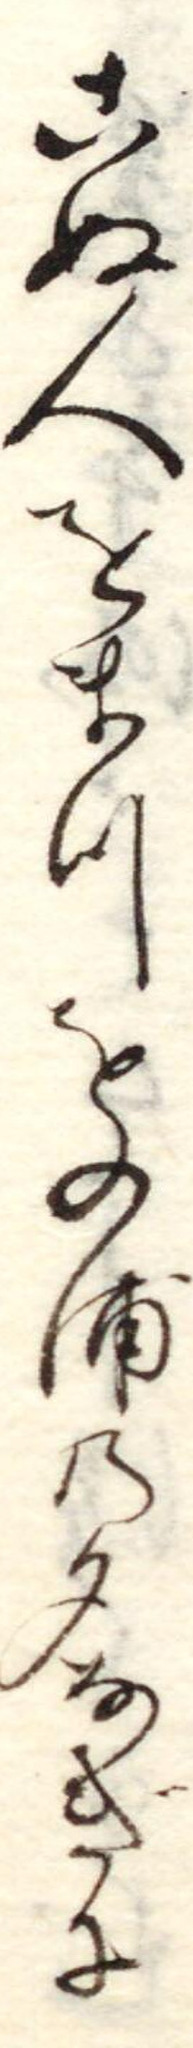こぬ人をまつをの浦の夕なぎに
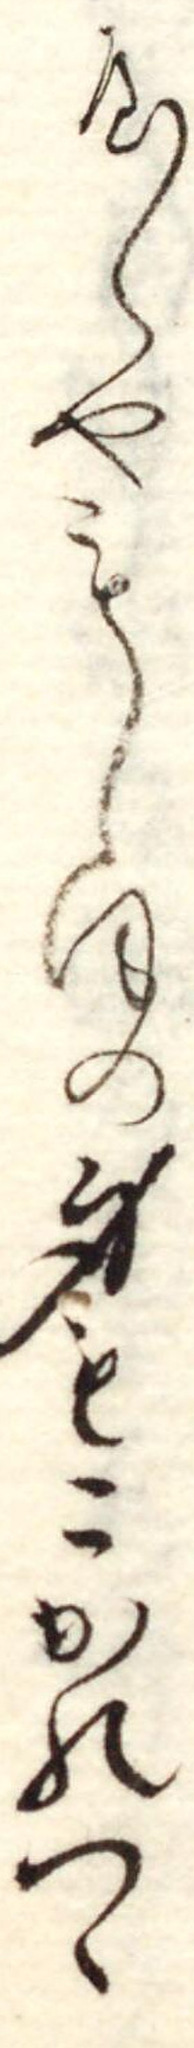やくやもしほの身もこかれつゝ
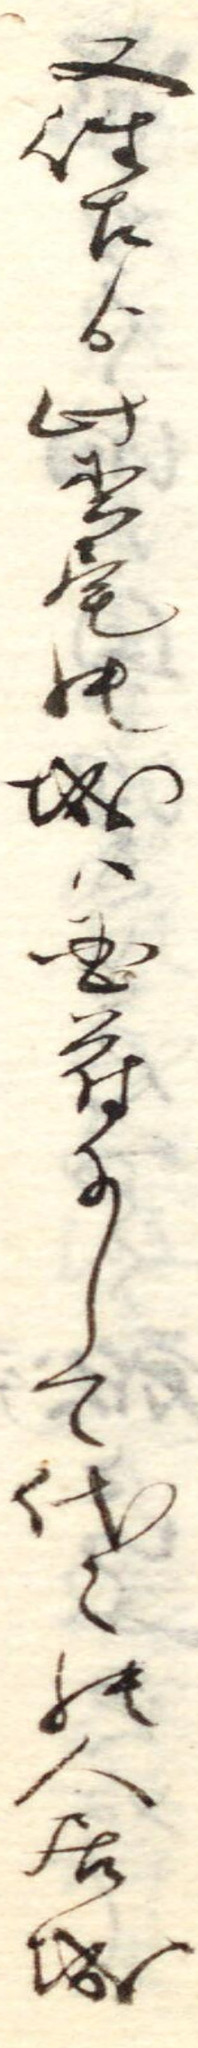又往古ゟ此枩尾の城は国府にて代々の人居城
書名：能登名跡誌
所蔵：Ishikawa Prefectural Library
